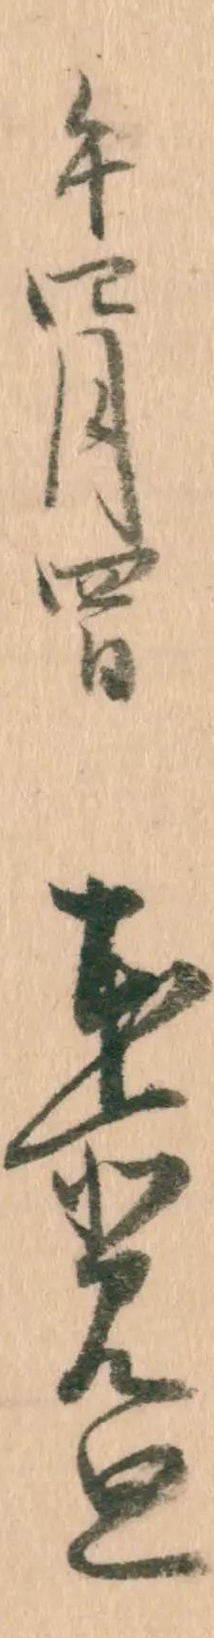│午四月四日本所見廻
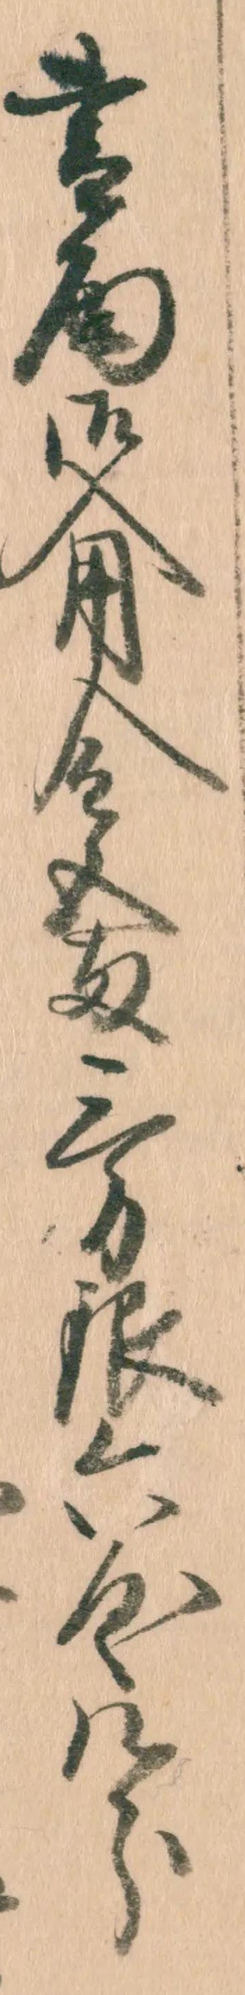│書面御入用金五両三分銀六匁八分
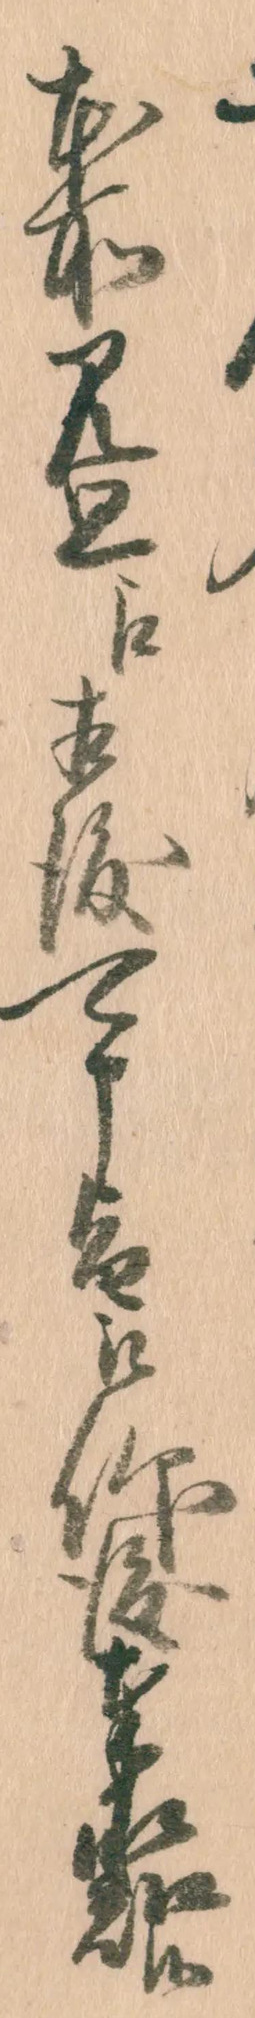│本所見回え相渡可申旨被仰渡奉承知候
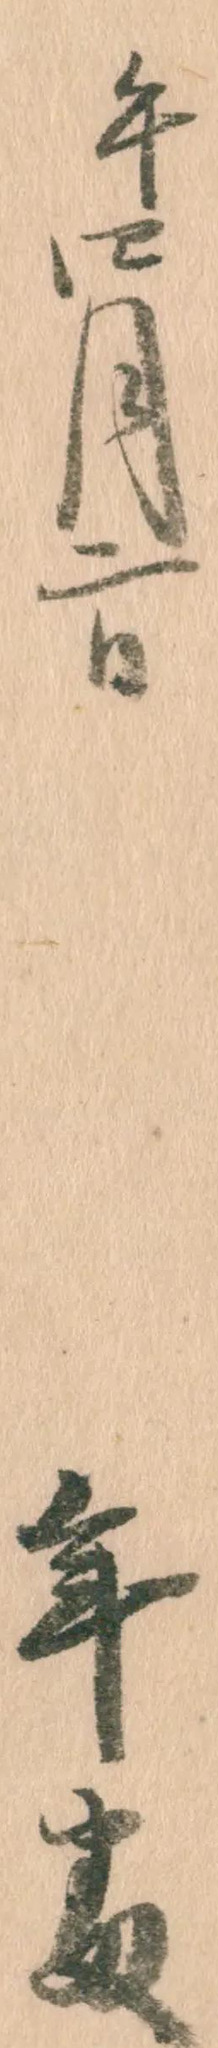│午四月二日年番

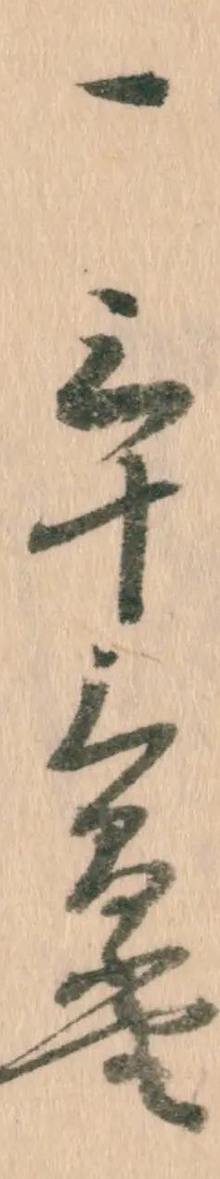一三十三間堂
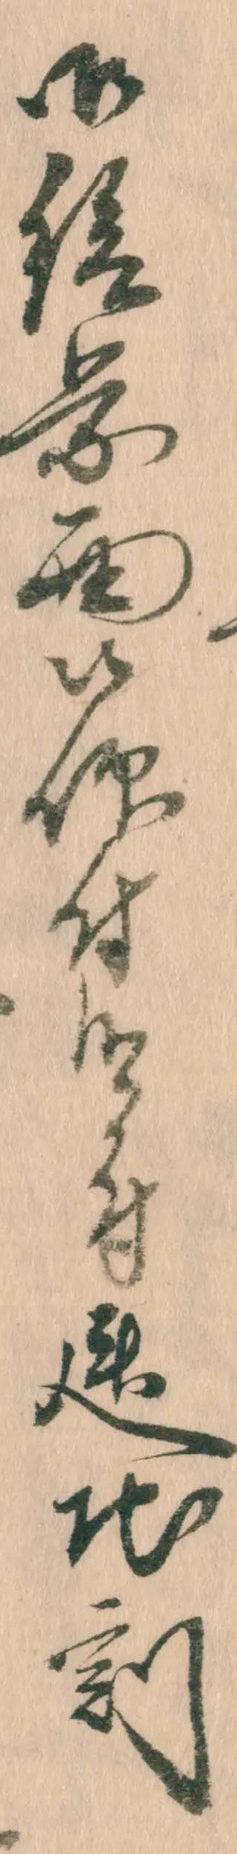御絵図面被仰付候ニ付建地割
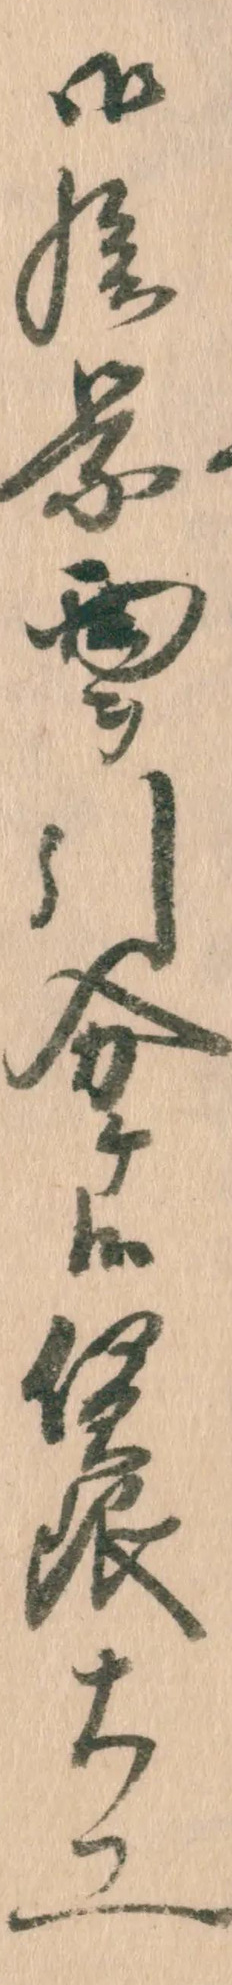御絵図面ヲ引分ケ候賃銀大工
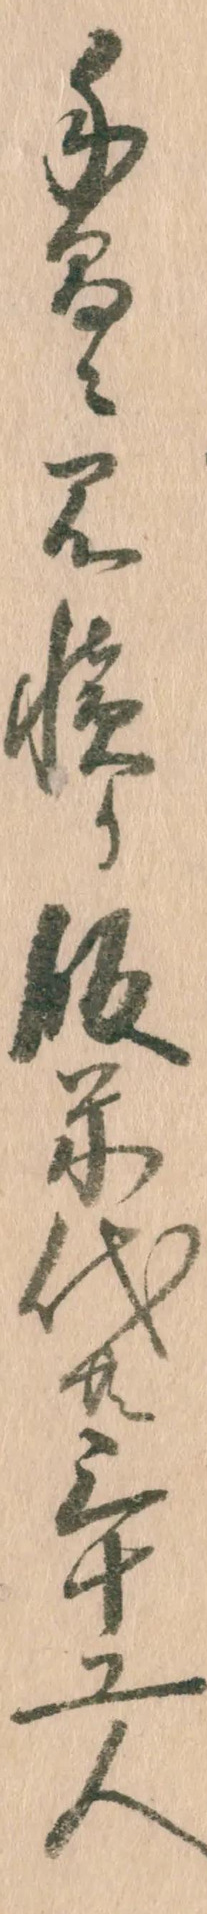手間ニ見積り飯米代共三十工人
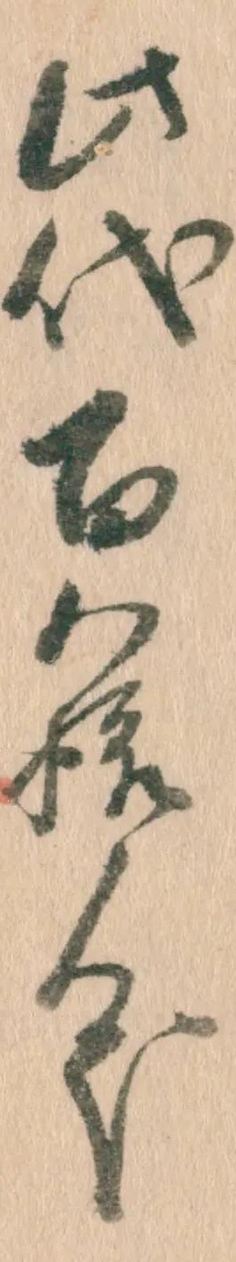此代百八拾匁

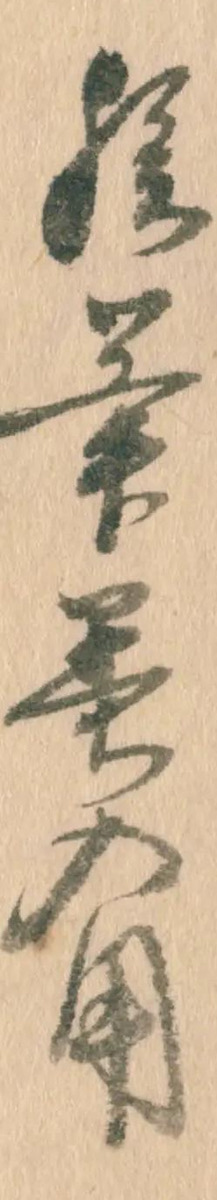絵筆墨入用
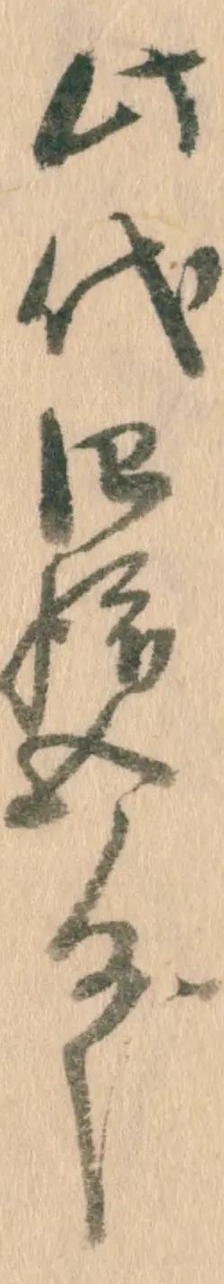此代四拾五匁
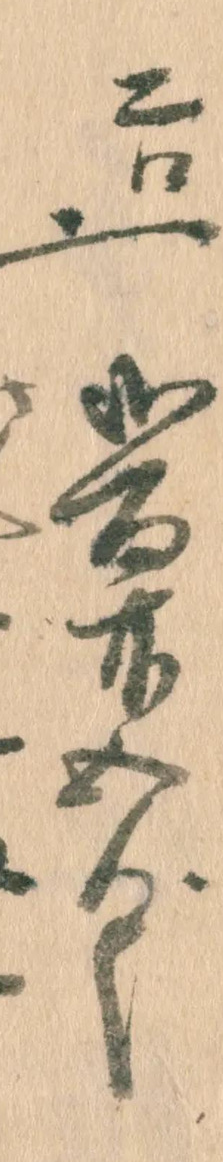二口〆弐百廿五匁
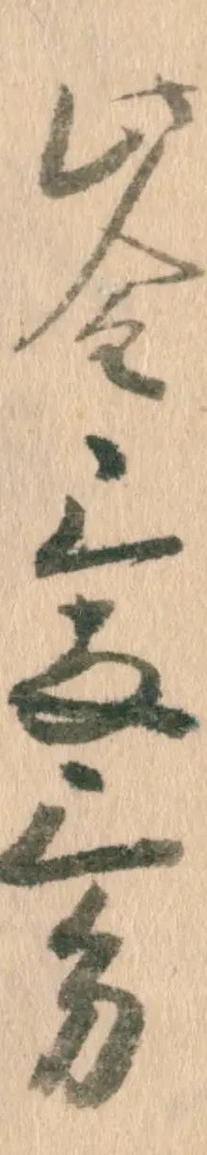此金三両三分
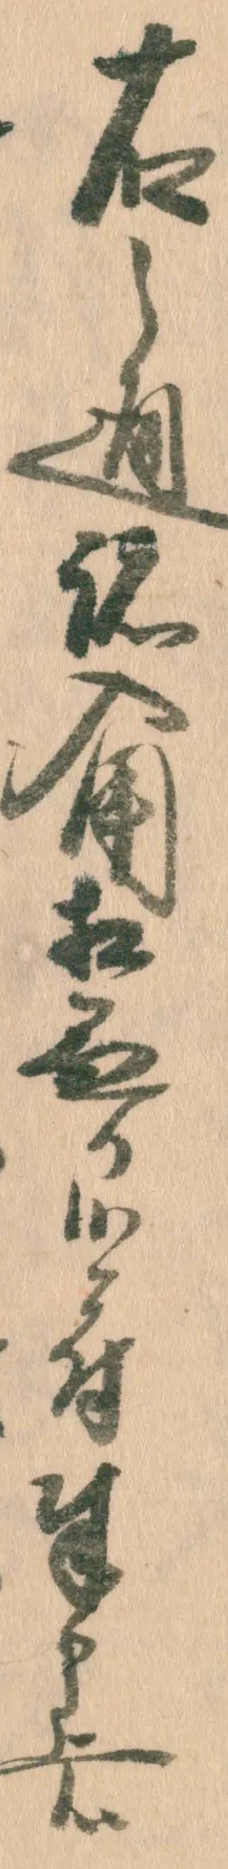右之通諸入用相懸り候ニ付奉申上候
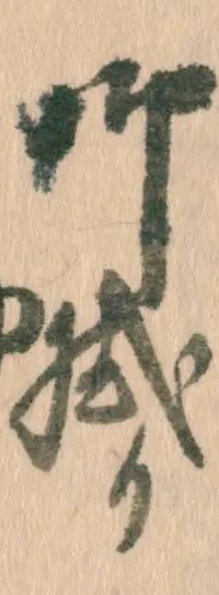御掛り
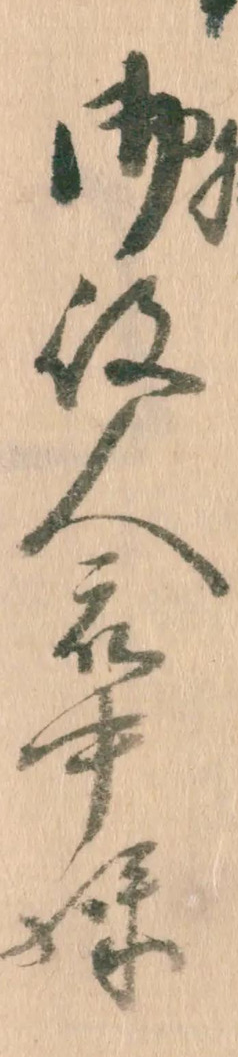御役人衆中様
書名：三十三間堂. [2]
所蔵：国立国会図書館 National Diet Library, JAPAN
